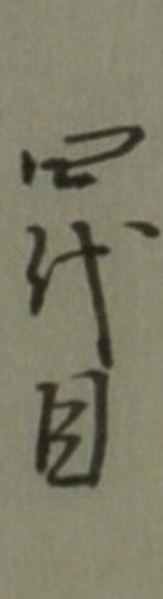四代目
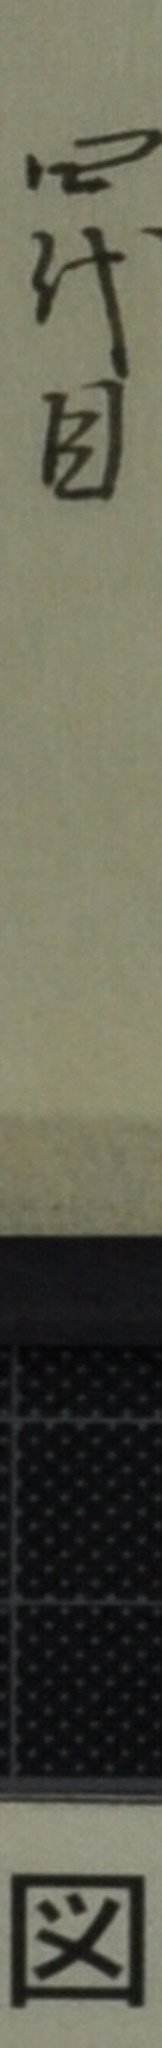四代目
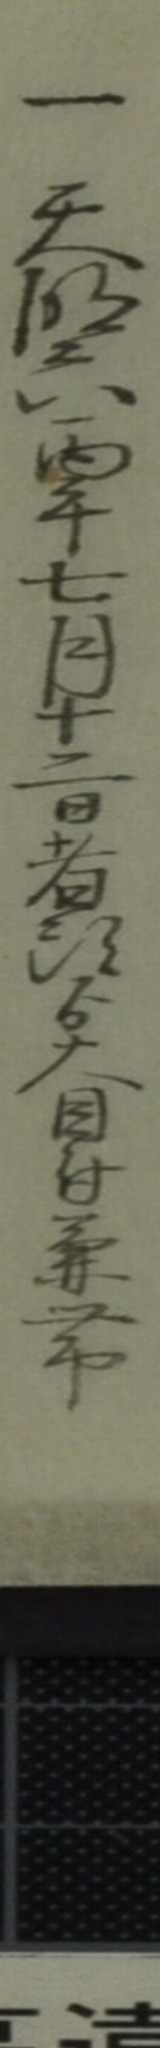一天明六丙午七月十二日者頭ゟ大目付兼帯
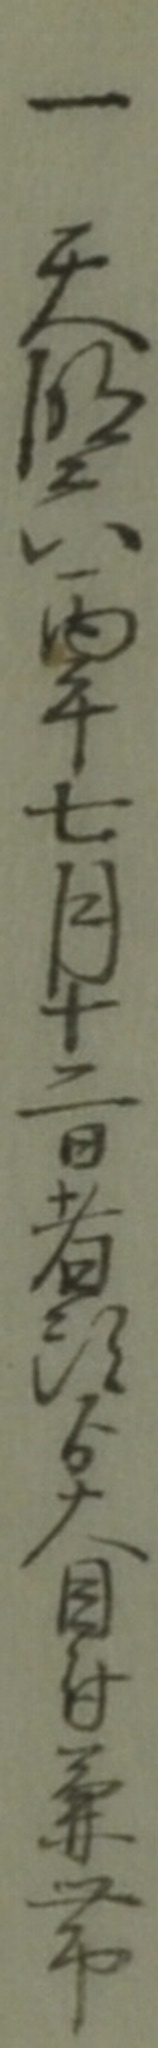一天明六丙午七月十二日者頭ゟ大目付兼帯
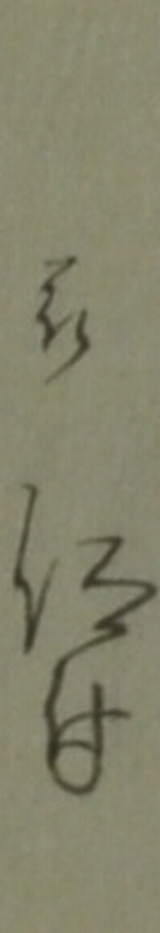被仰付
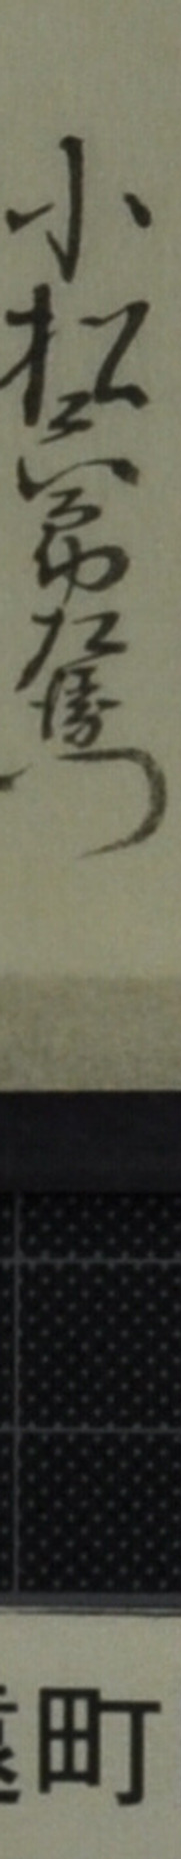小松六郎左衛門
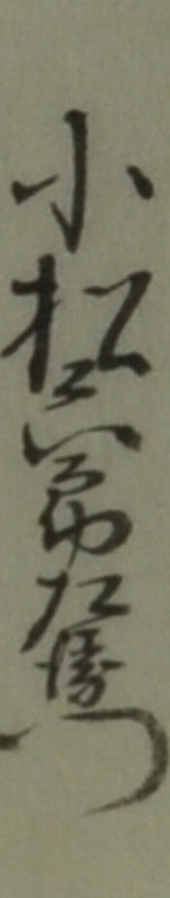小松六郎左衛門
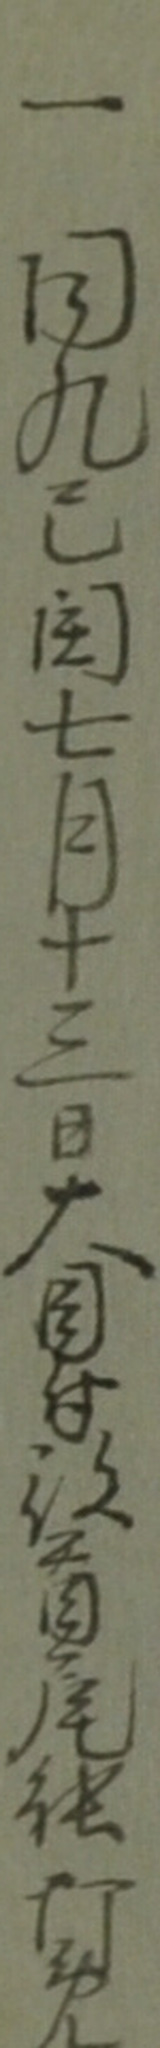一同九巳閏七月十三日大目付役首尾能御免
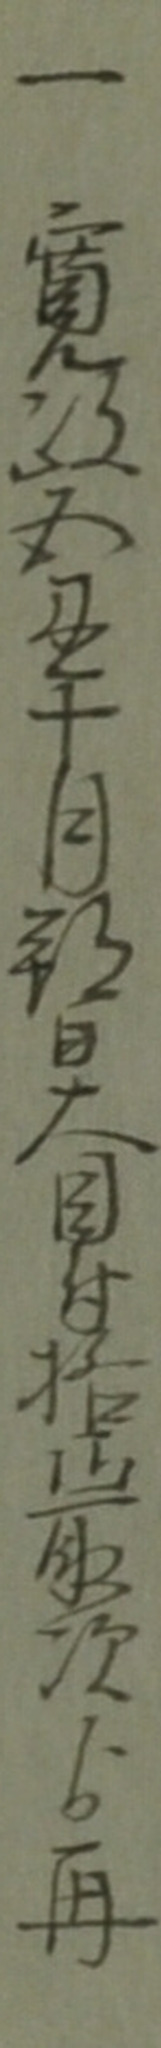一寛政五丑十月朔日大目付格御取次ゟ再
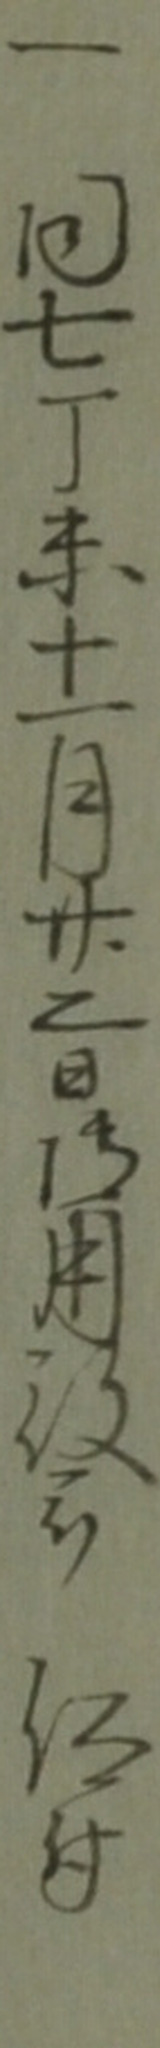一同七丁未十一月廿二日御用役被仰付
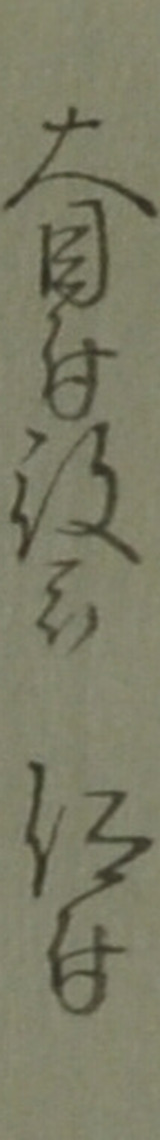大目付役被仰付
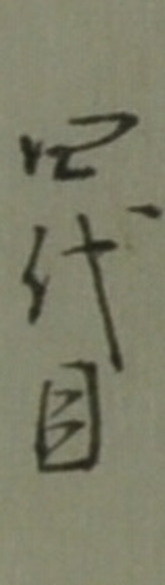四代目
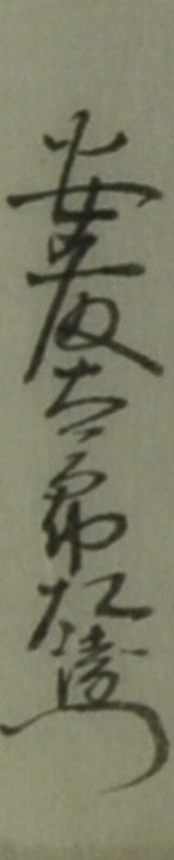安藤太郎左衛門
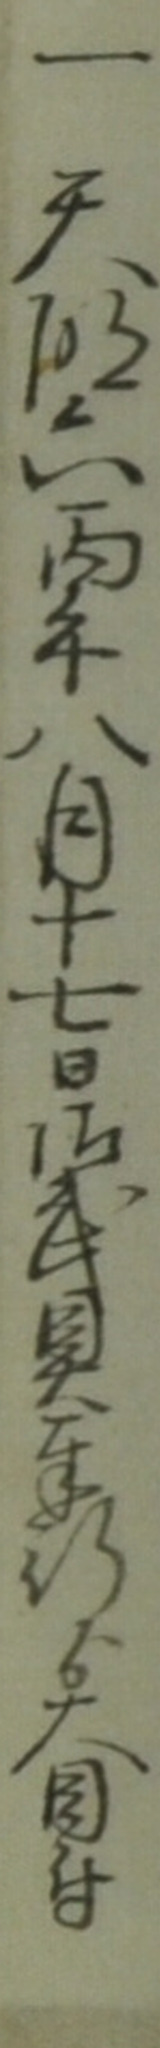一天明六丙午八月十七日御武具奉行ゟ大目付

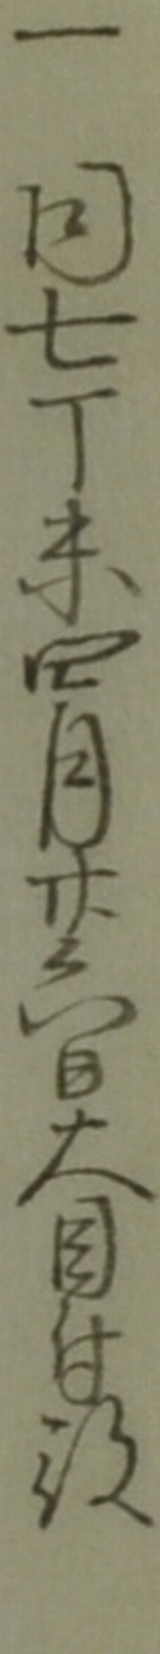一同七丁未四月廿六日大目付役
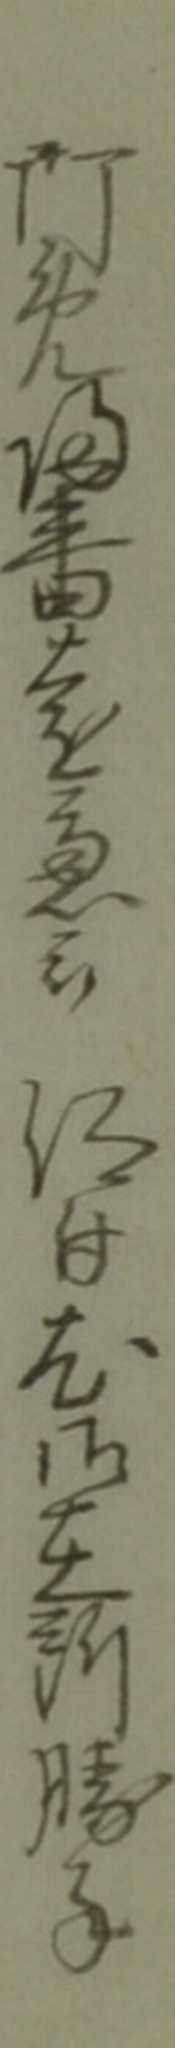御免帰番遠慮被仰付尤御在所勝手
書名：諸御役代々録（三）
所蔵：伊那市立高遠町図書館・合同会社AMANE
